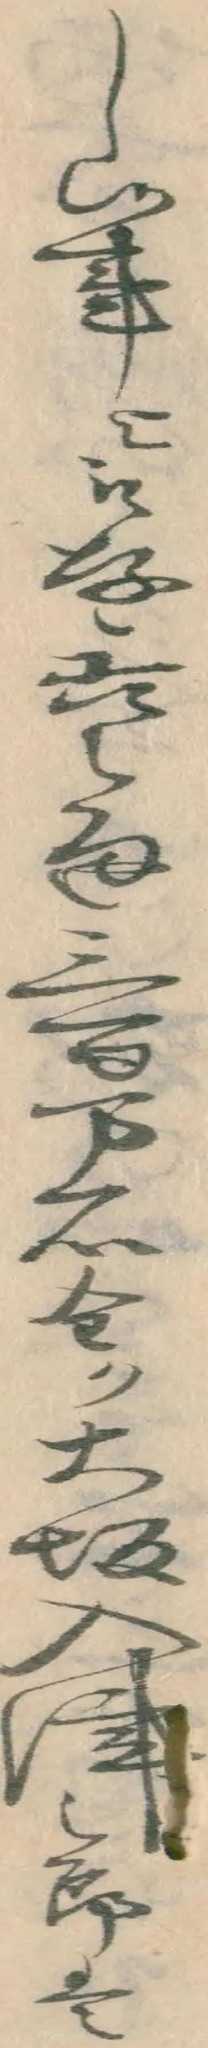し候事と被存候右之通三百万石全く大坂入津之節は
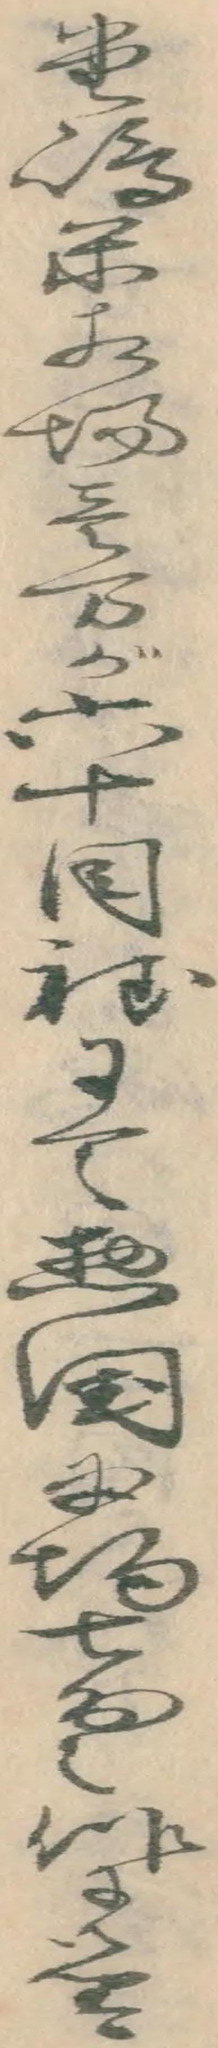堂島米相場壱万が六十目程にて惣国平均七分之作に御座候
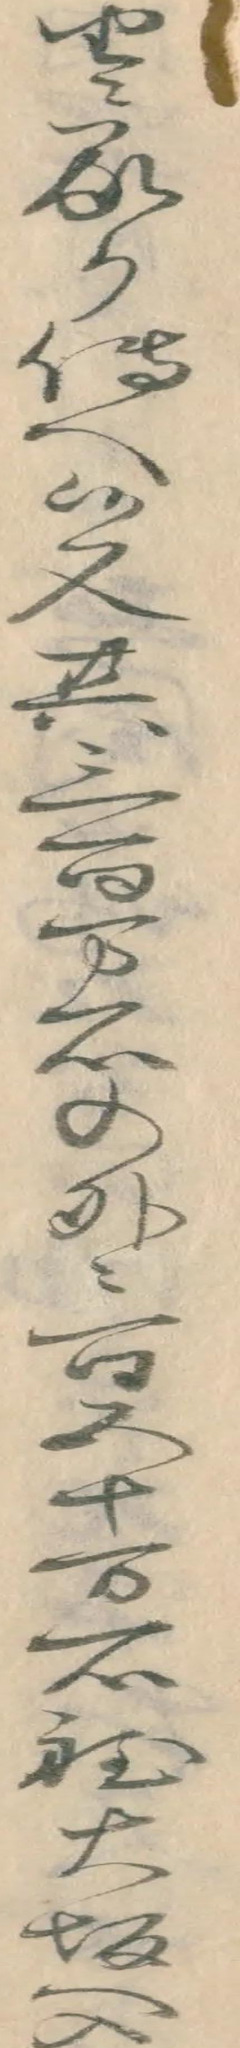由に承り伝へ候又其三百万石の外に百五十万石程大坂へ入
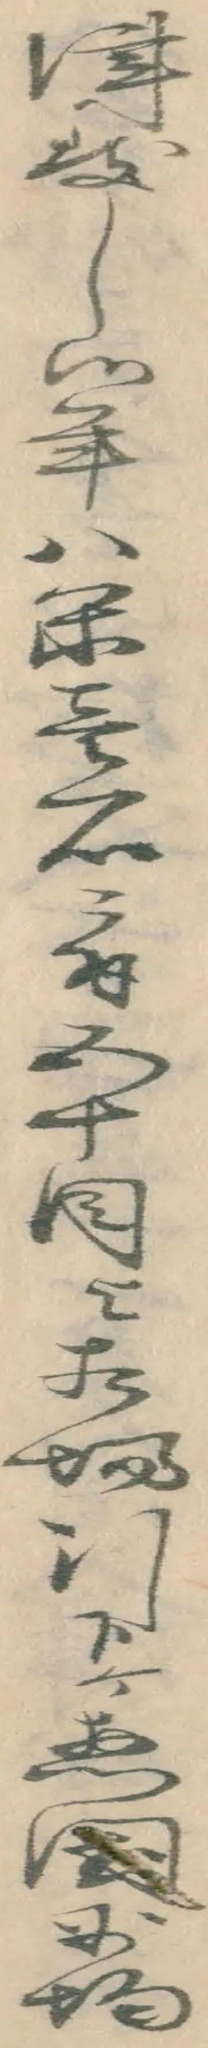津致し候年は米壱石に付五十目と相場引下け惣国平均

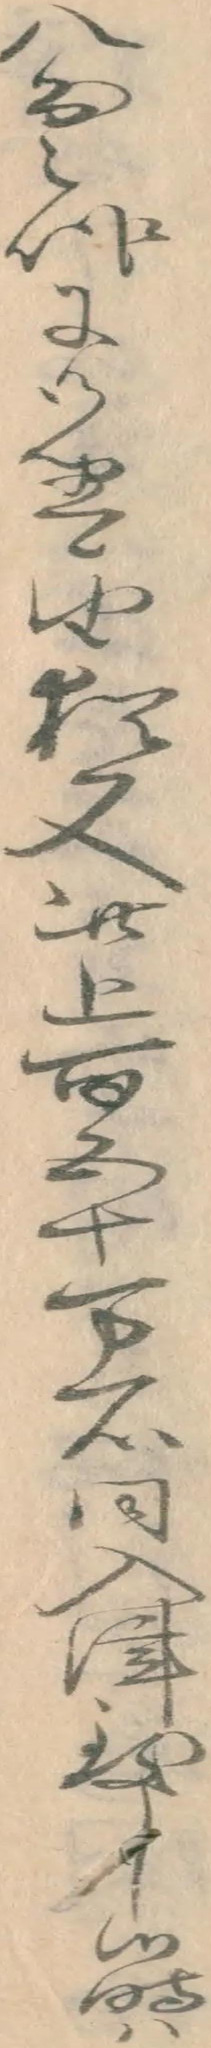八分之作に御坐候由猶又此上百五十万石同入津致し候時は
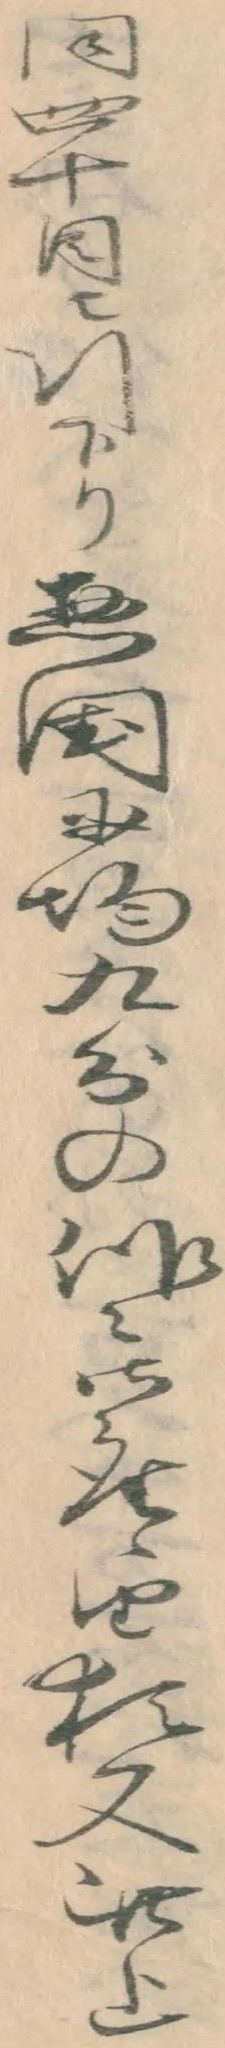同四十目も引下り惣国平均九分の作に御座候由猶又此上
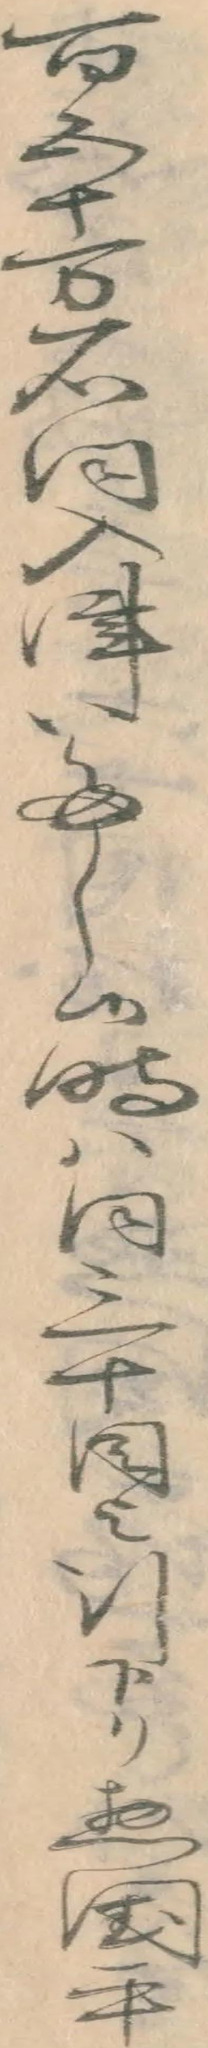百五十万石同入津いたし候時は同三十目と引下り惣国平
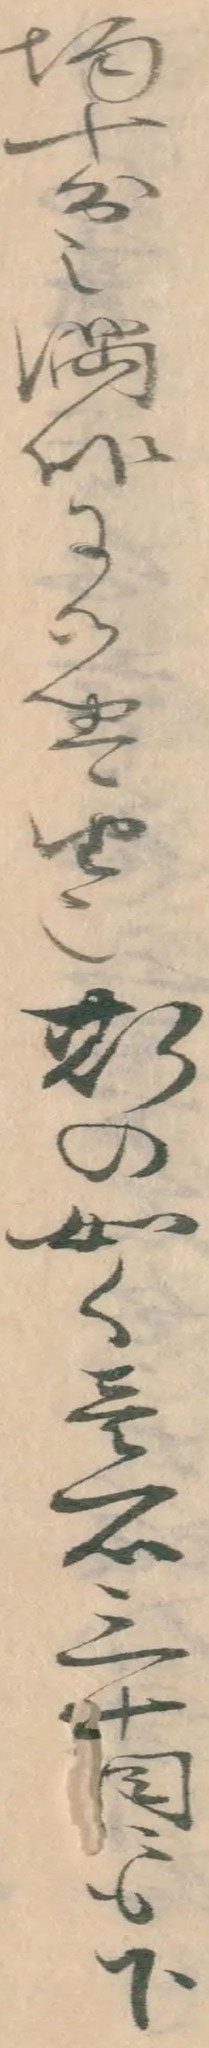均十分之満作に御坐候由也斯の如く壱石三十目にも下
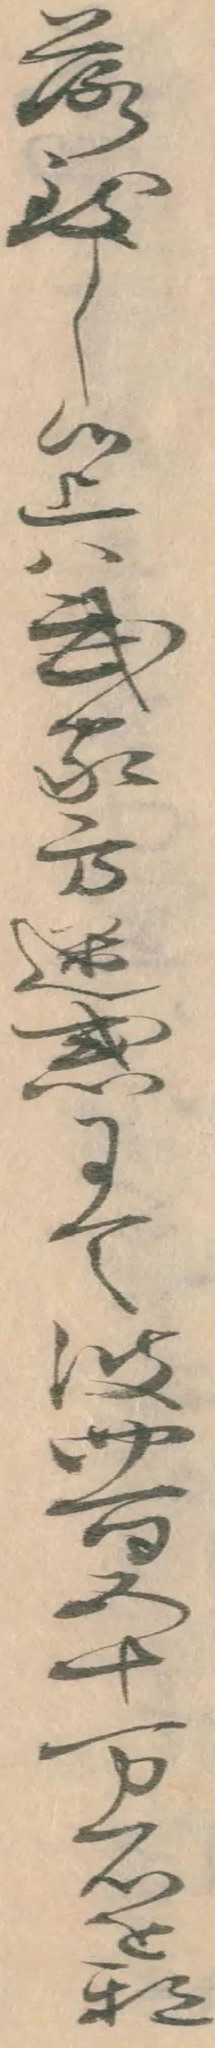落致し候上は武家方迷惑にて彼四百五十万石を邪
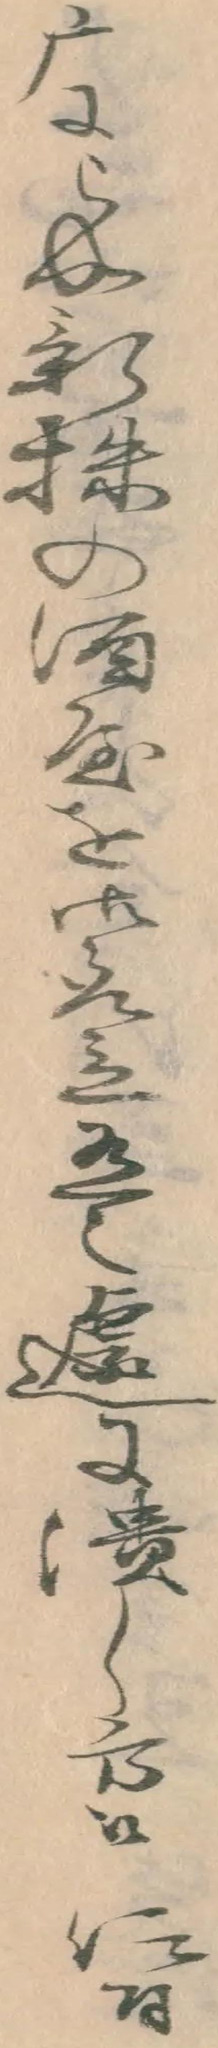魔に被成新株の酒屋を御取立有之遽に潰し方被仰付
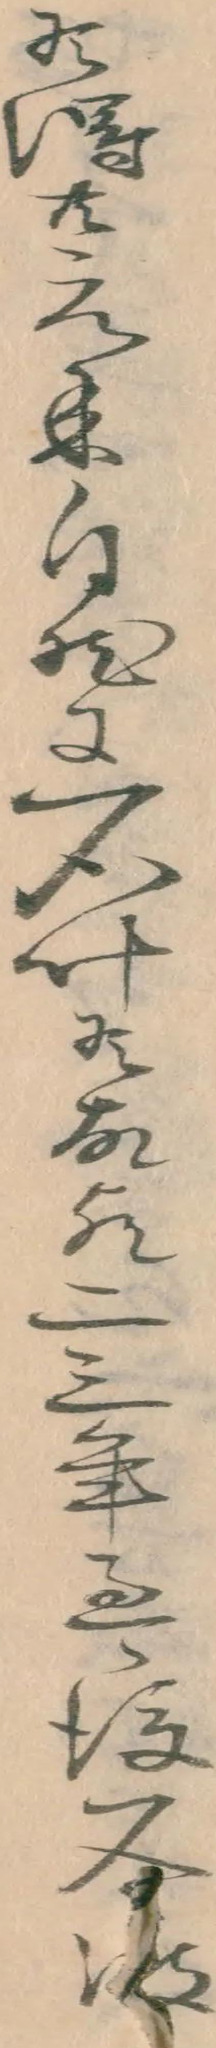候得共元来自然に不叶候故歟二三年過候後又彼
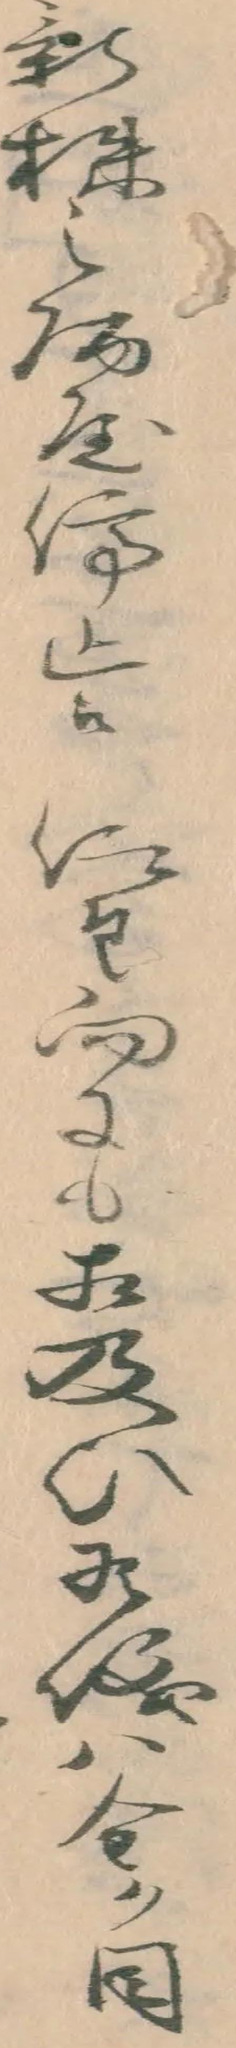新株之酒屋停止被仰付候向にも相及ひ候儀は全く目
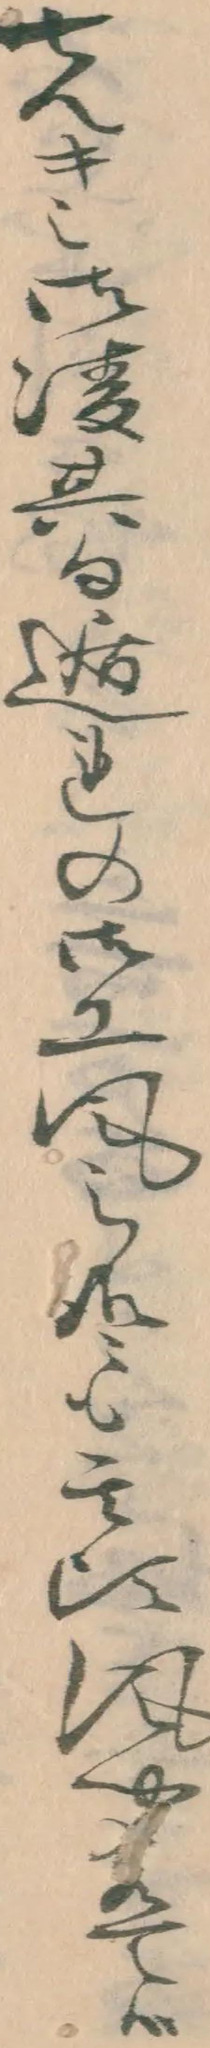先き之御凌其日遁れの御工風之様にも其頃風聞有之候
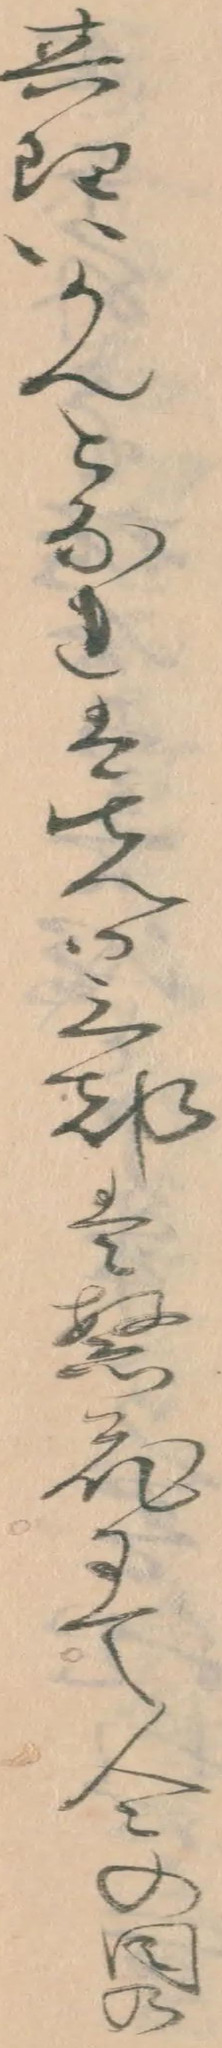其理いかんとなれは先つ三都は繁花にて人々の目の
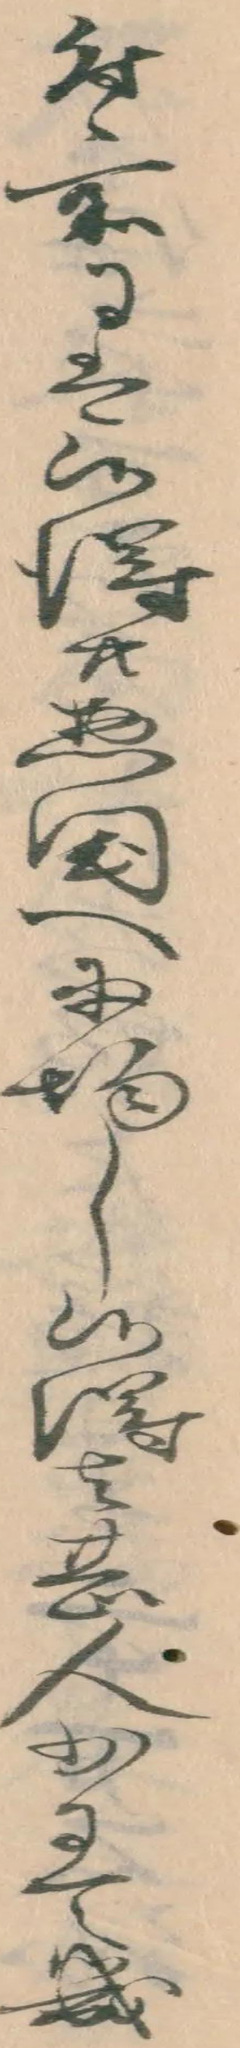付候所には候得共惣国へ平均し候得者甚人少にて幾
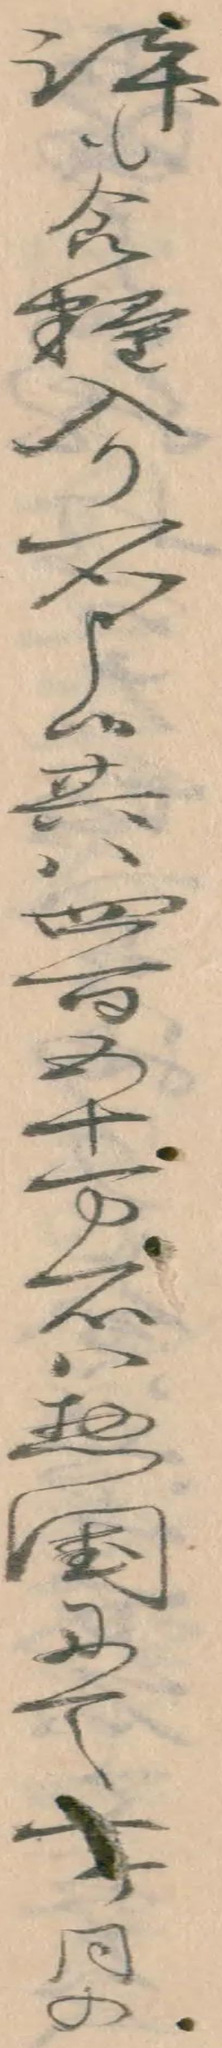許も食糧入り不申候其は四百五十万石は惣国にて一ヶ月の
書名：斎庭之穂
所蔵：国立国会図書館 National Diet Library, JAPAN
